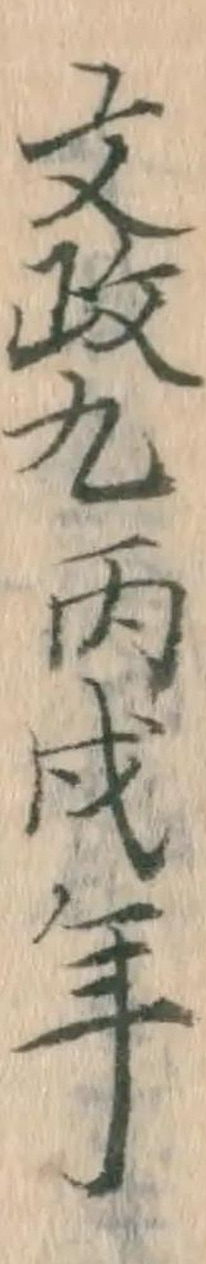文政九丙戌年
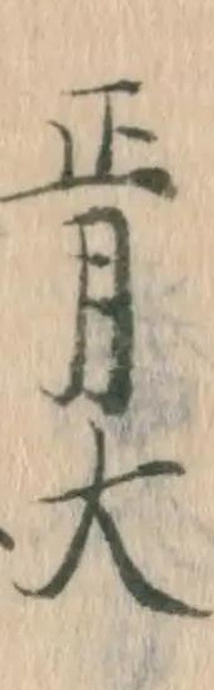正月大
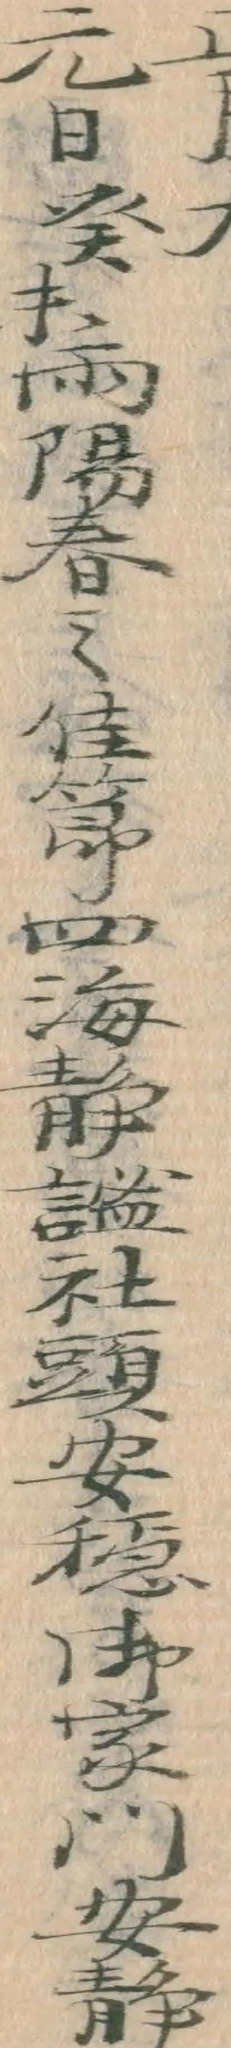元日癸未雨陽春之佳節四海静謐社頭安穏御家門安静
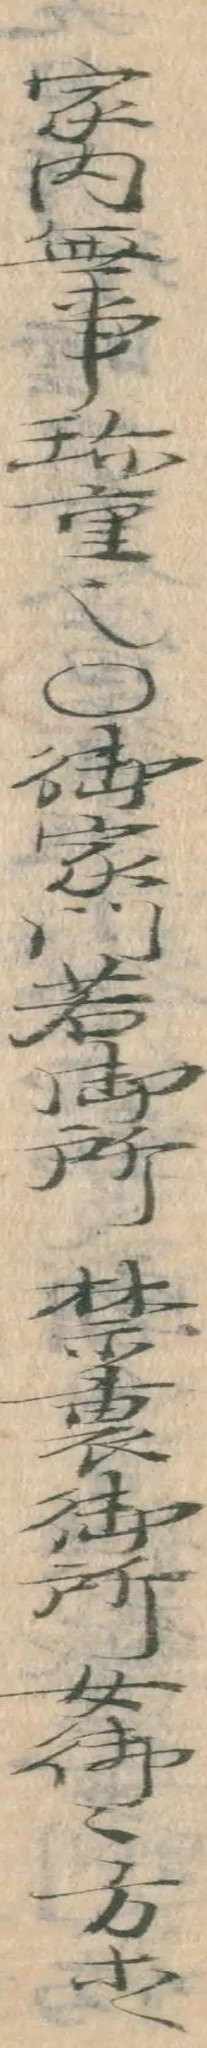家内無事珎重也○御家門若御所禁裏御所女御御方等へ
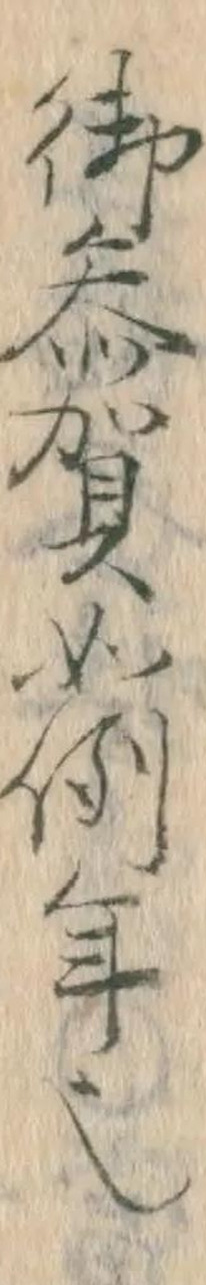御参賀如例年也
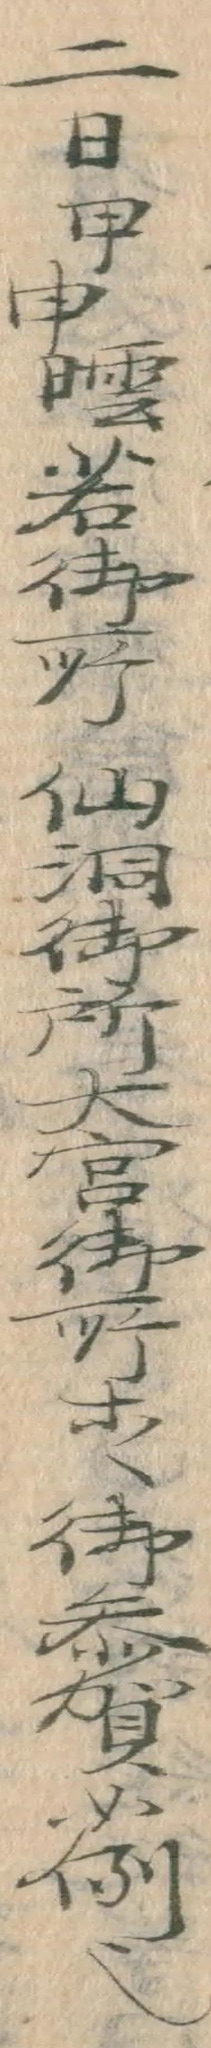二日甲申曇若御所仙洞御所大宮御所等へ御参賀如例也
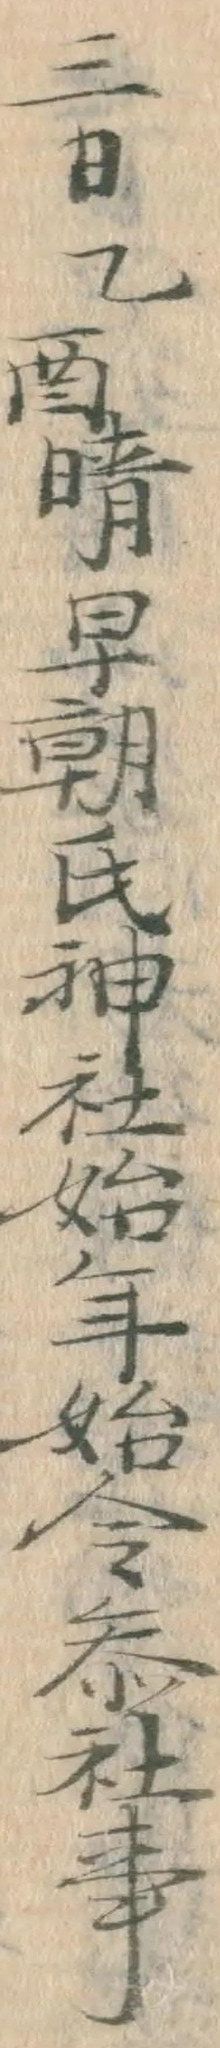三日乙酉晴早朝氏神社始年始令参社事
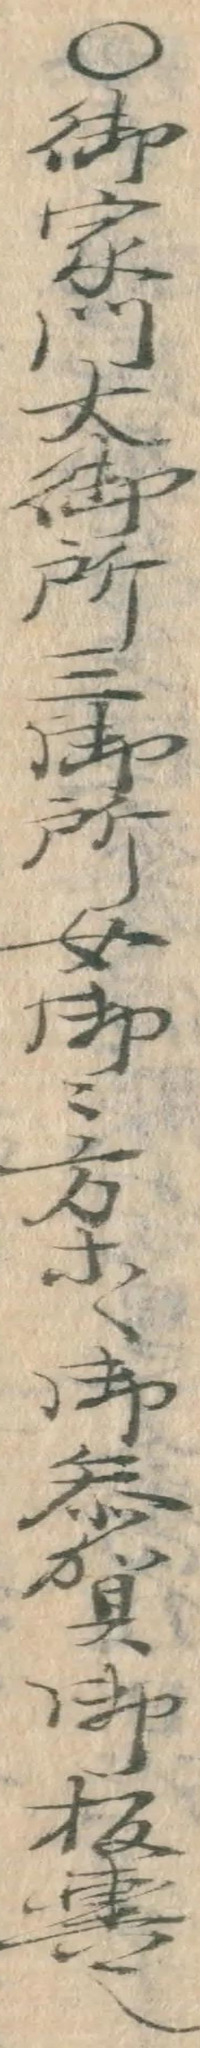○御家門大御所三御所女御々方等へ御参賀御板輿也
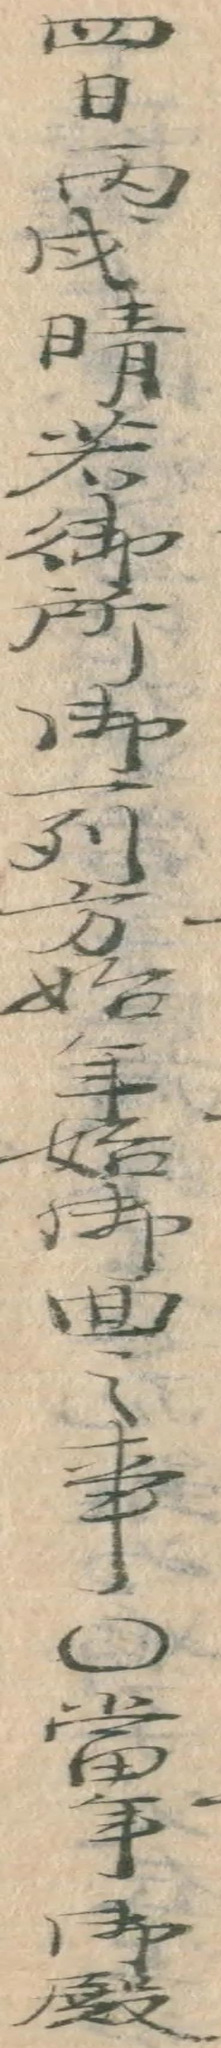四日丙戌晴若御所御一列方始年始御回之事○當年御殿
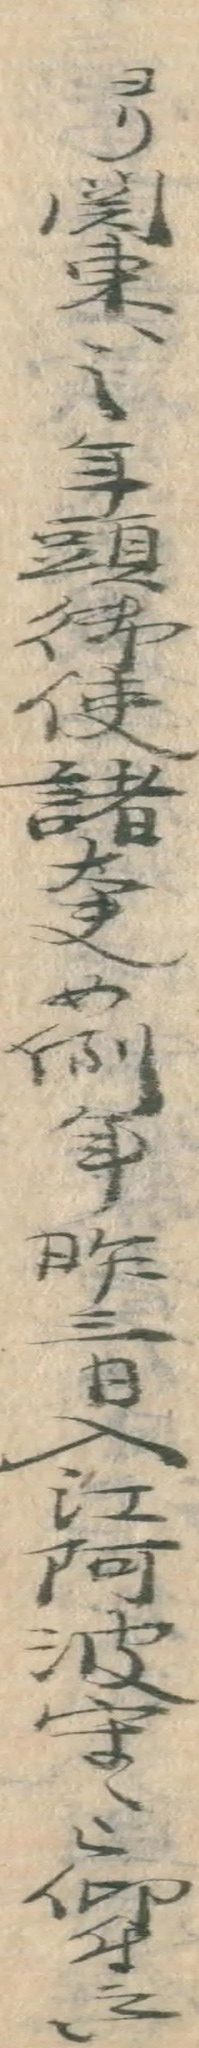ヨリ関東へ之年頭御使諸大夫如例年昨三日入江阿波守へ被仰付云々
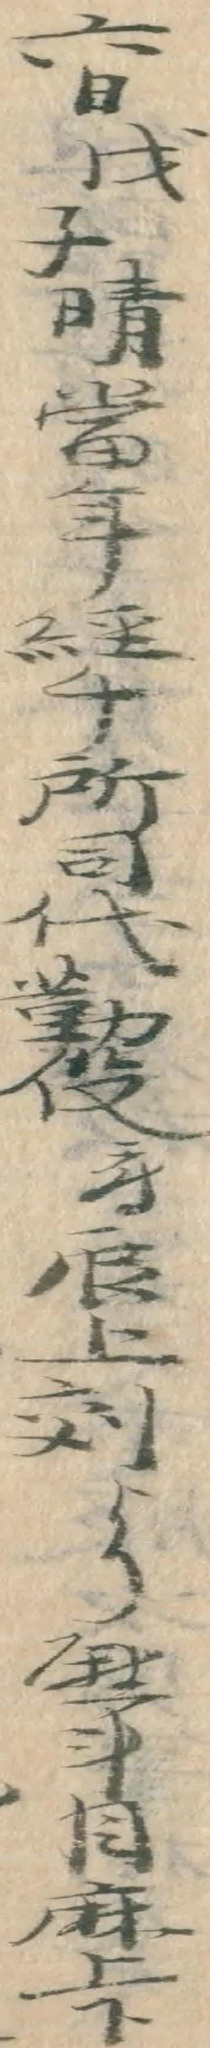六日戊子晴當年経千所司代勤役ニ付辰上刻より熨斗目麻上下
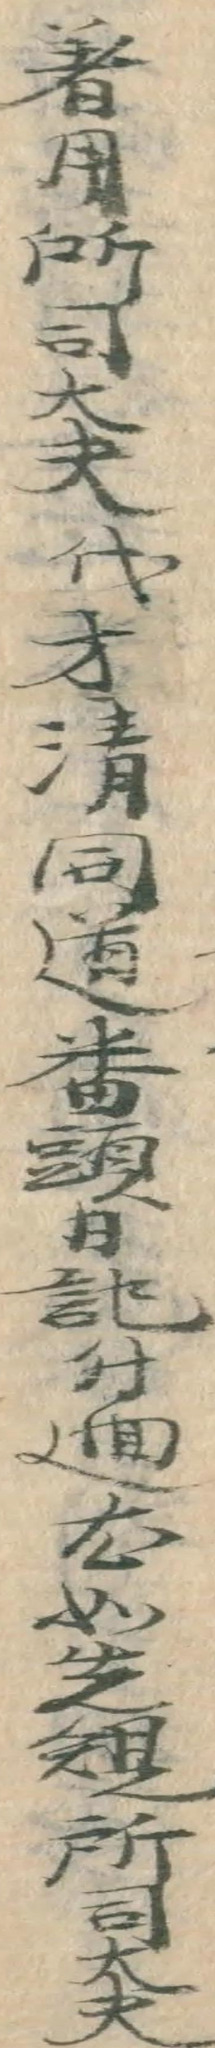着用所司大夫代才清同道番頭日記付廻尤如先規所司大夫

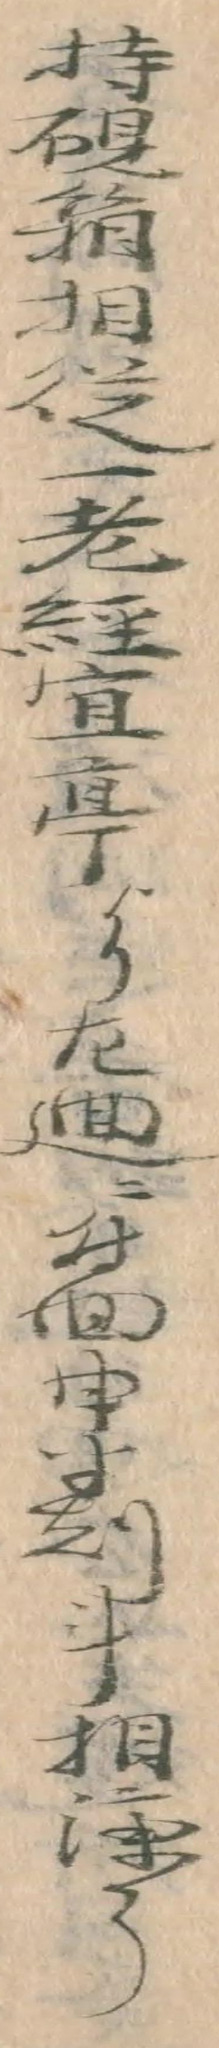持硯箱相従一老経宜亭より左廻ニ付回申半刻斗相済了
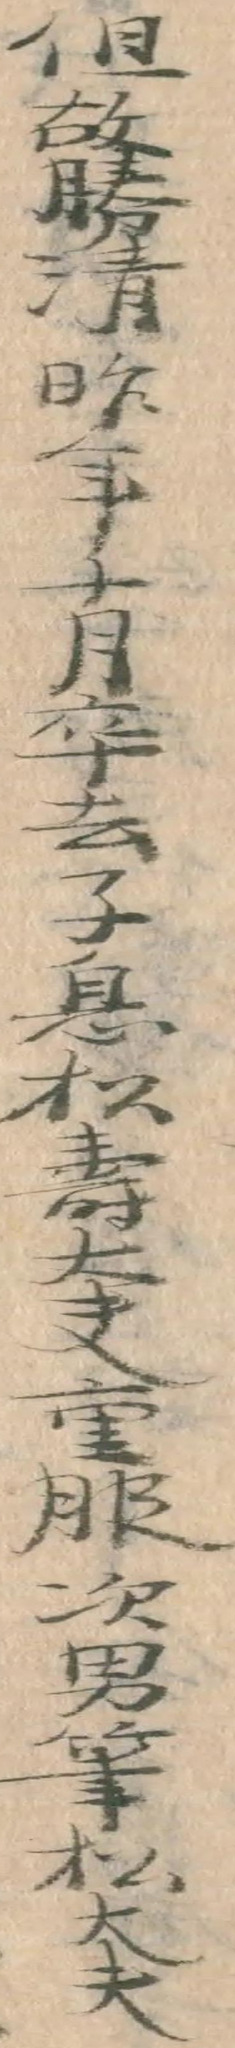但故勝清昨年十月卒去子息松壽大夫重服次男筆松大夫
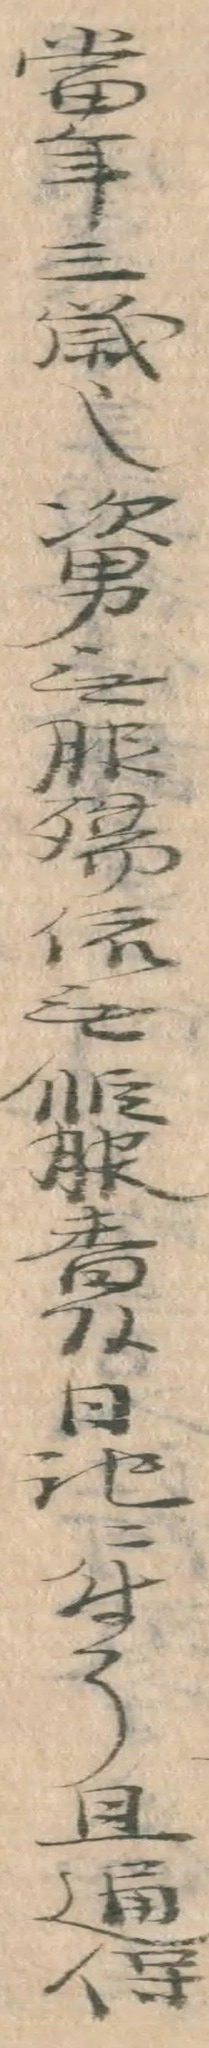當年三歳也次男無服殤依無仮服番頭日記ニ付了且通保
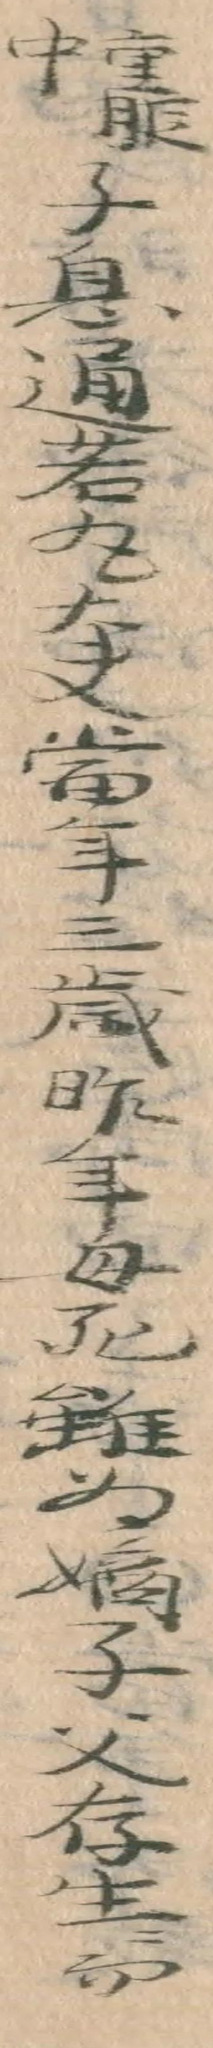重服中子息通若丸大夫當年三歳昨年母死雖為嫡子父存生ニ而
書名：賀茂社記録. 第65冊
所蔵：国立国会図書館 National Diet Library, JAPAN
